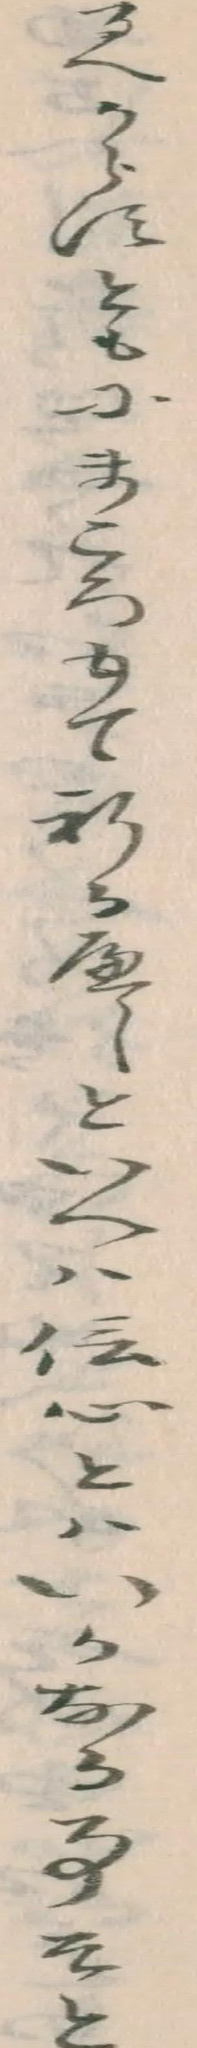るへからすともにまころもて祈るへしといへは信心とはいかなる事そと
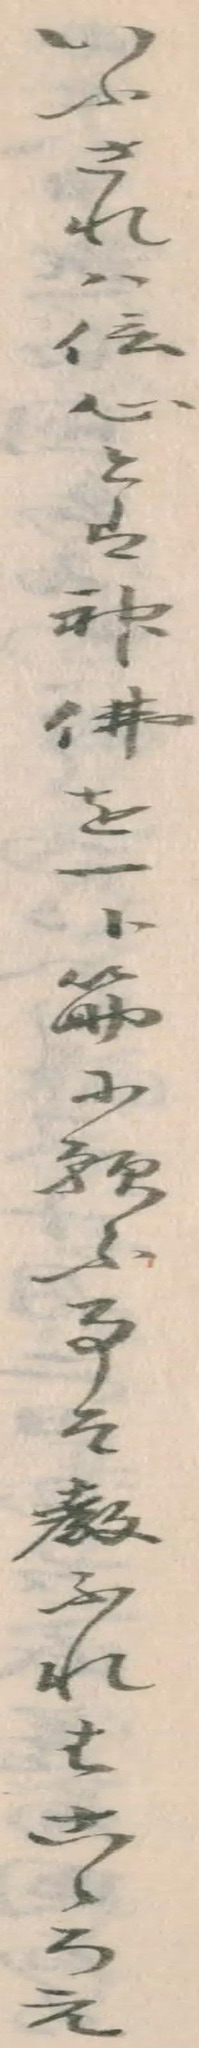いふされは信心とは神仏を一ト筋に願ふ事そ教ふれはこゝろえ
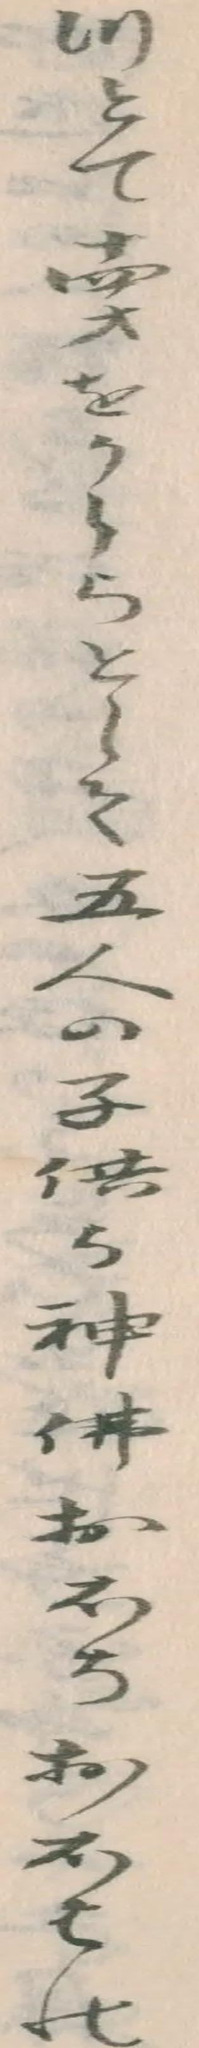つとて十四才をかしらとして五人の子供ら神仏おほちおほはの
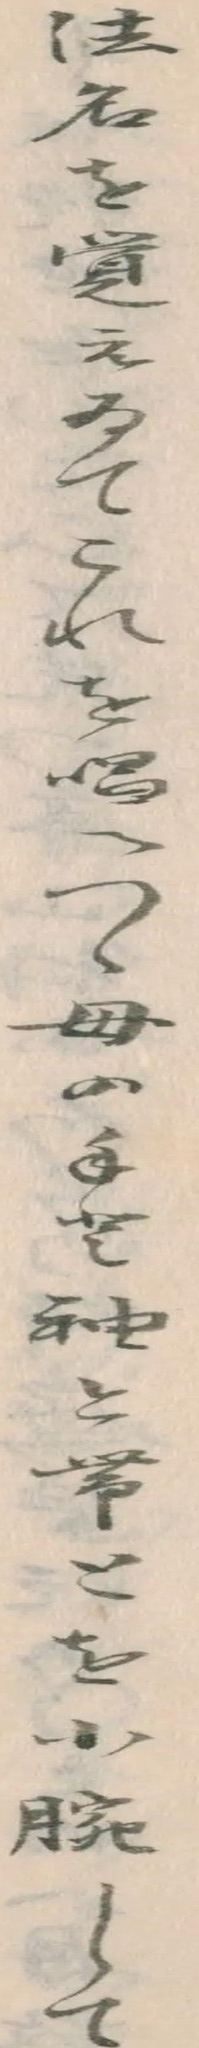法名を覚えゐてこれを唱へつゝ母の手と袖と帯とを小腕して
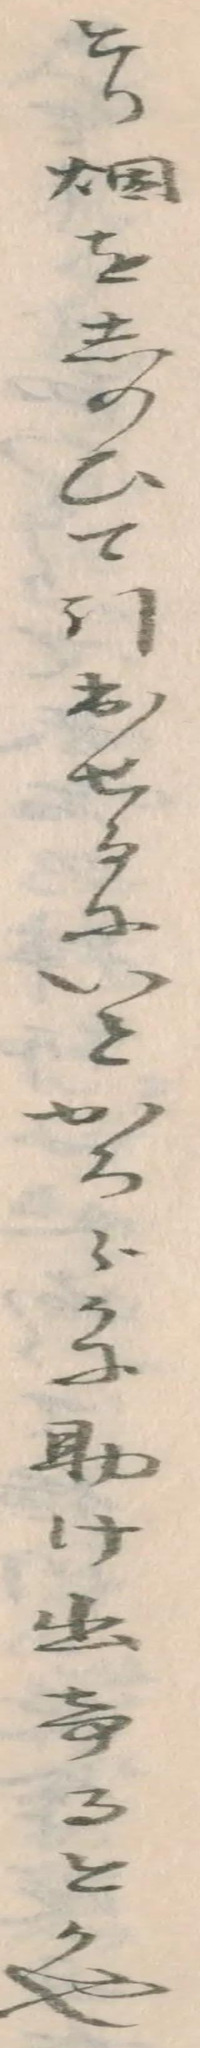とり烟をしのひて引出せるにいとかろらかに助け出けるとかや
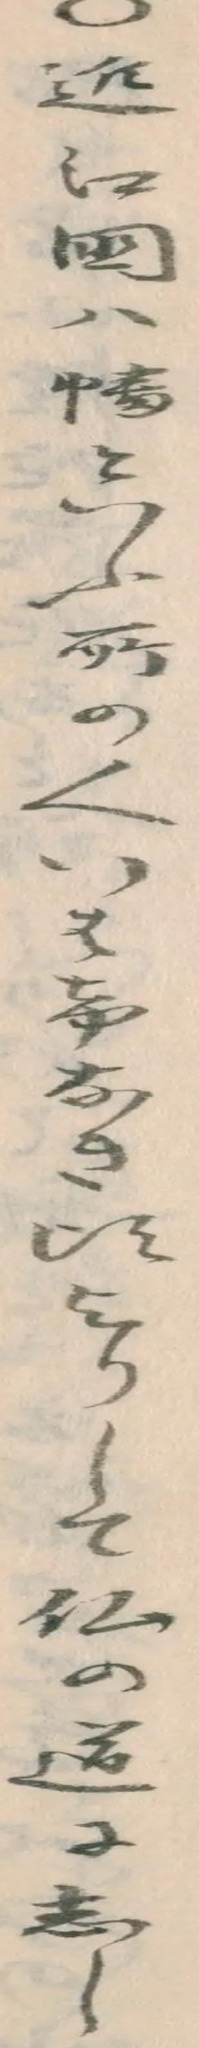○近江国ハ幡といふ所の人いはけなき頃よりして仏の道に志し

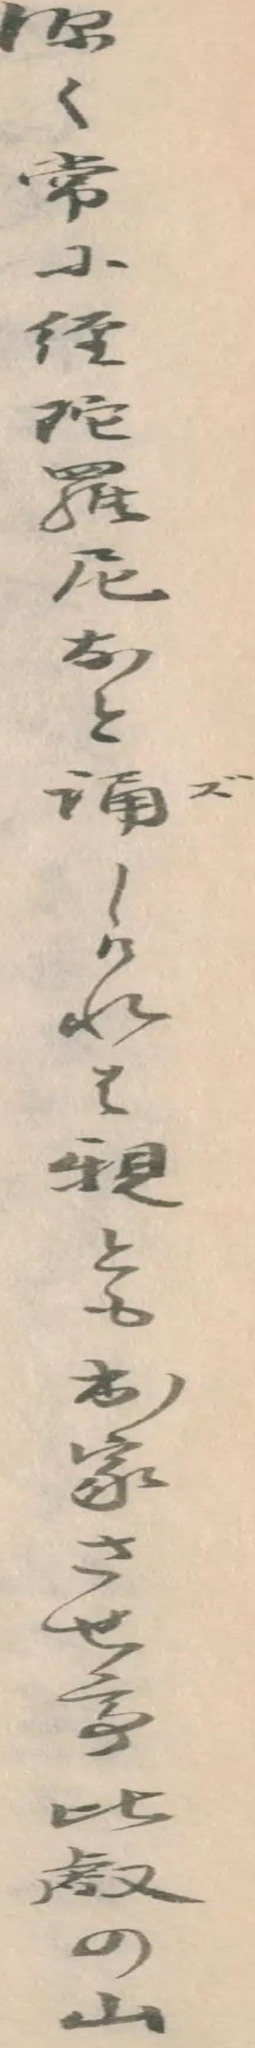深く常に経陀羅尼なと誦しけれは親とも出家させて比叡の山
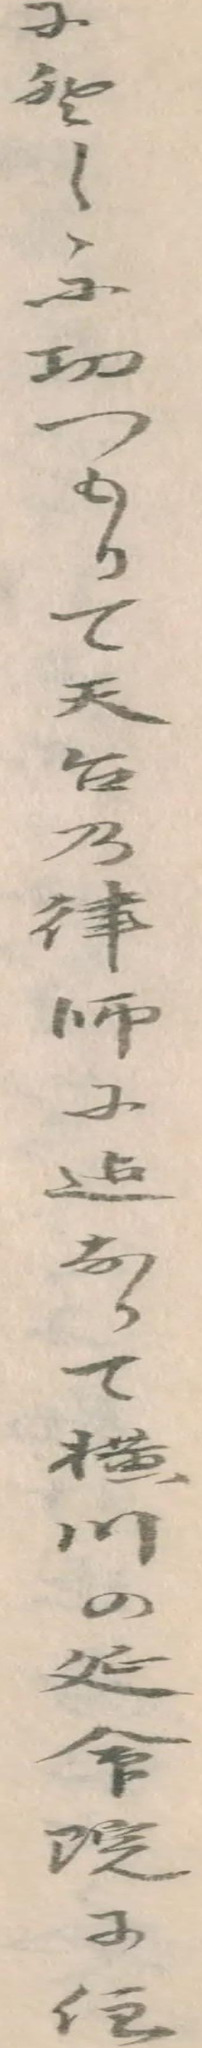に登しゝに功つもりて天台の律師に迄なりて横川の延命院に住
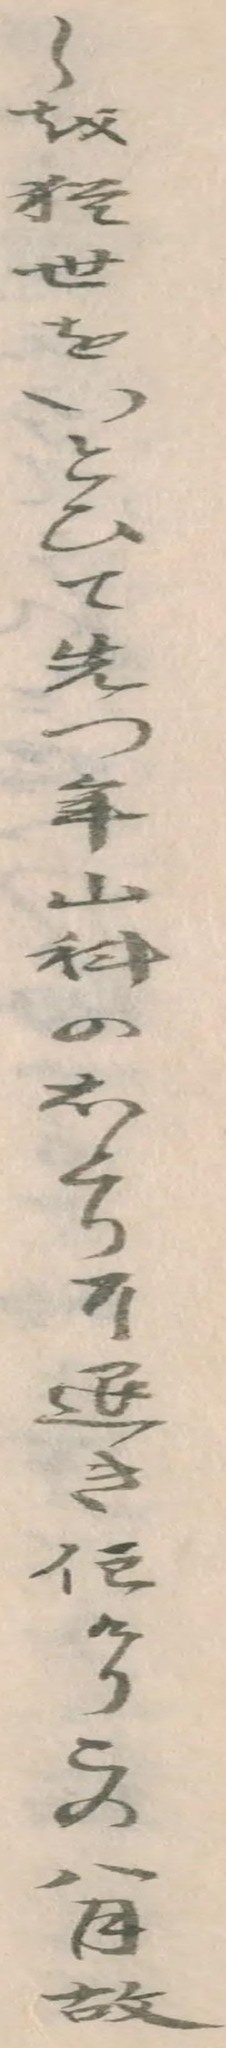しを猶世をいとひて先つ年山科のほとりに退き住けりこの八月故
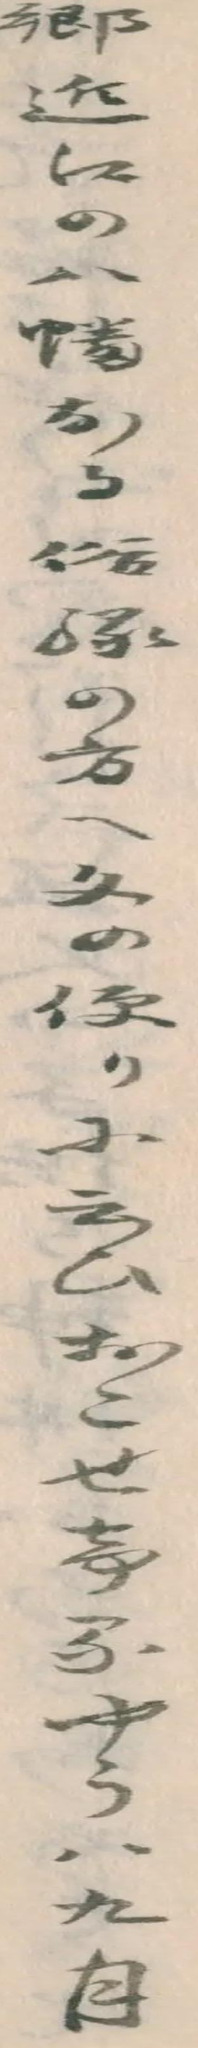郷近江の八幡なる俗縁の方へ文の便りに言ひおこせけるやうは九月
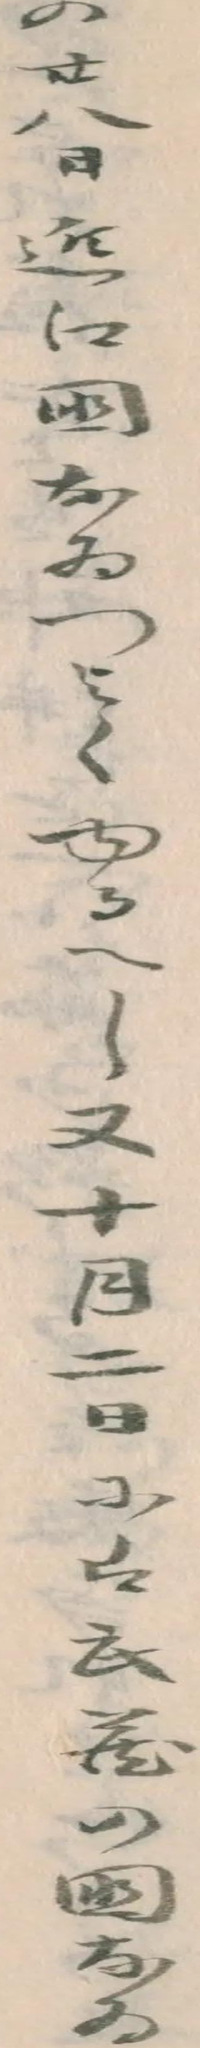の廿八日近江国なゐつよくゆるへし又十月二日には武蔵の国なゐ
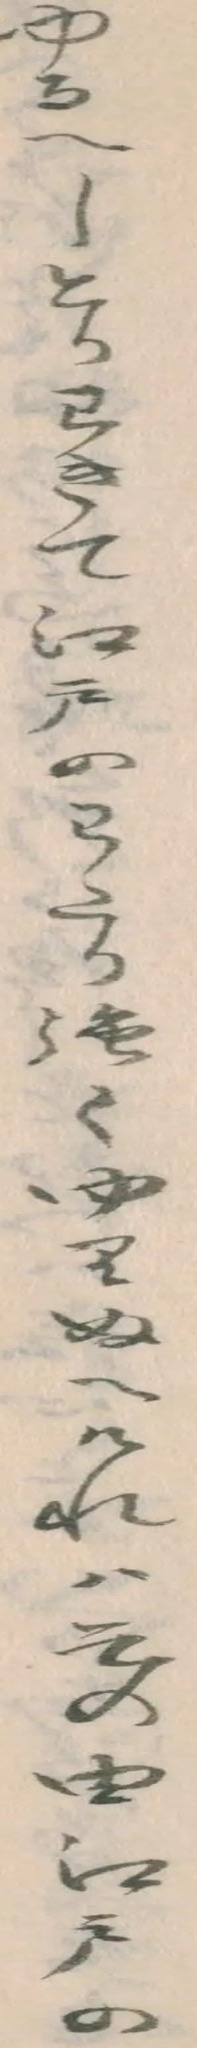ゆるへしとりわきて江戸のわたり強くゆりぬへけれはその由江戸の
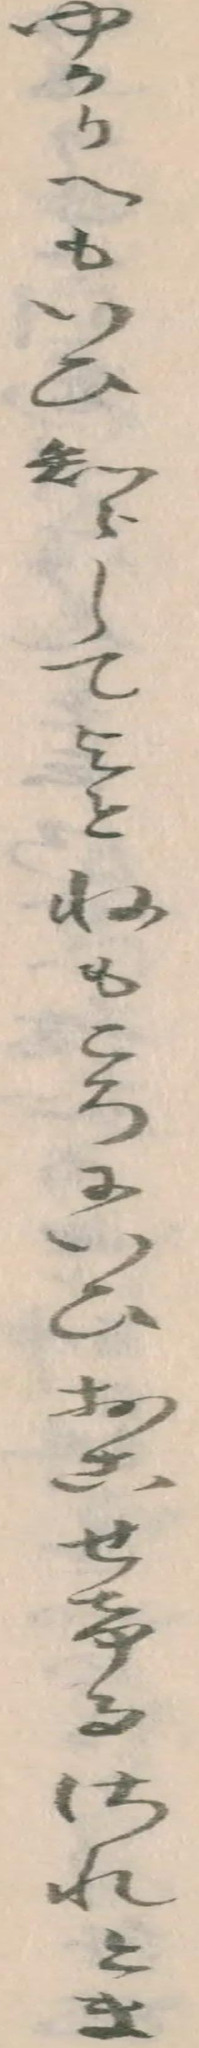ゆかりへもいひ知らしてよとねもころにいひおこせけるされとま
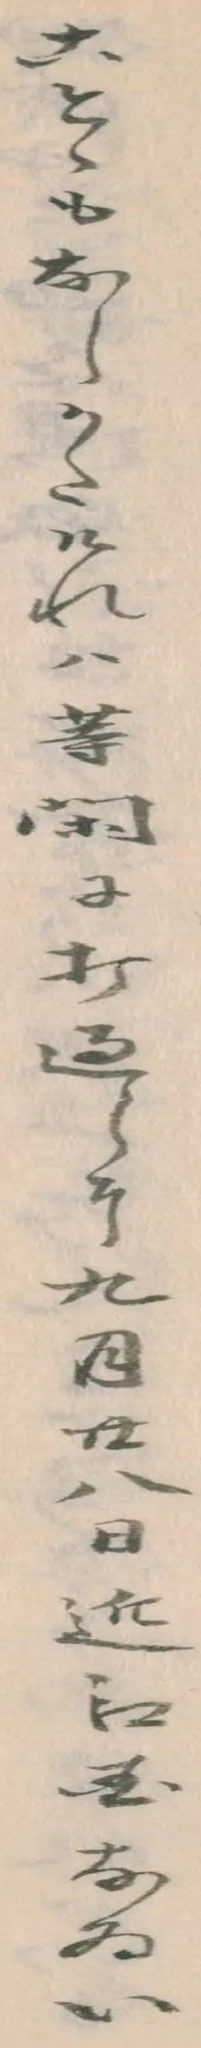ことゝもなしかたけれは等閑に打過しに九月廿八日近江国なゐい
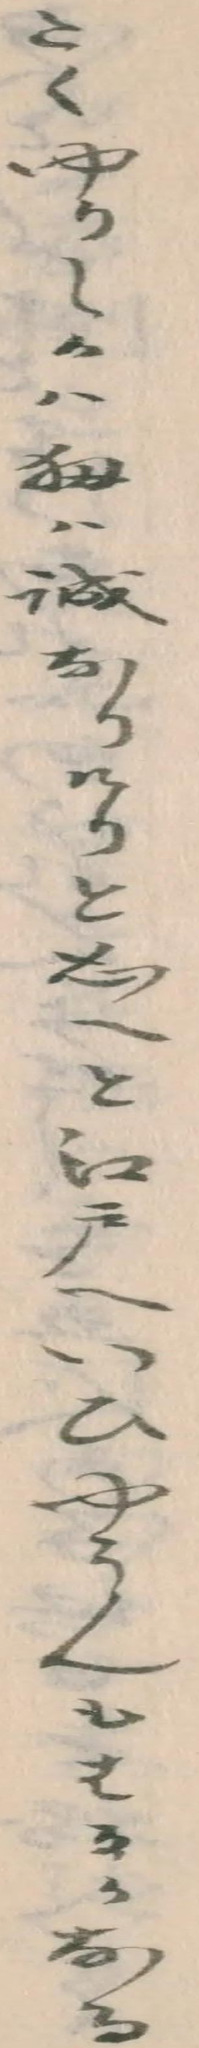たくゆりしかは扨は誠なりけりと思へと江戸へいひゆかんもはるかなる
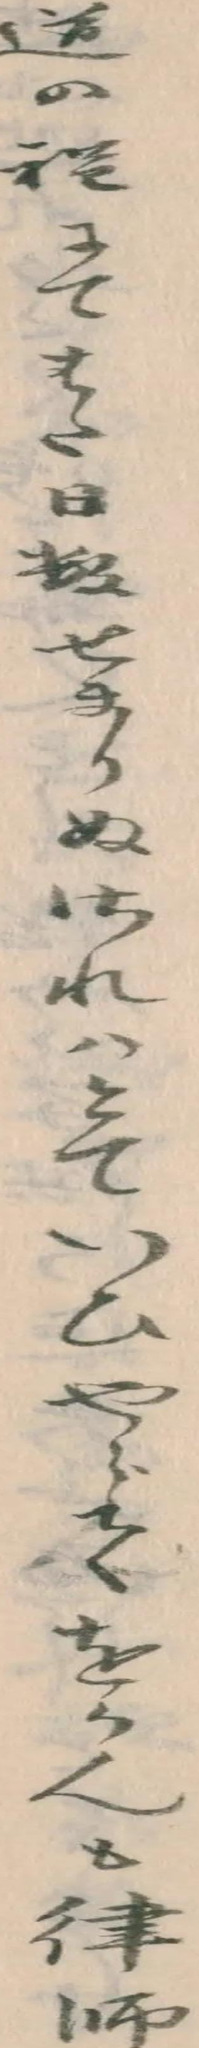道の程にてはた日数せまりぬされはとていひやらてをかんも律師
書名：地災撮要. 巻10(地震之部) 上,下
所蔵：国立国会図書館 National Diet Library, JAPAN
